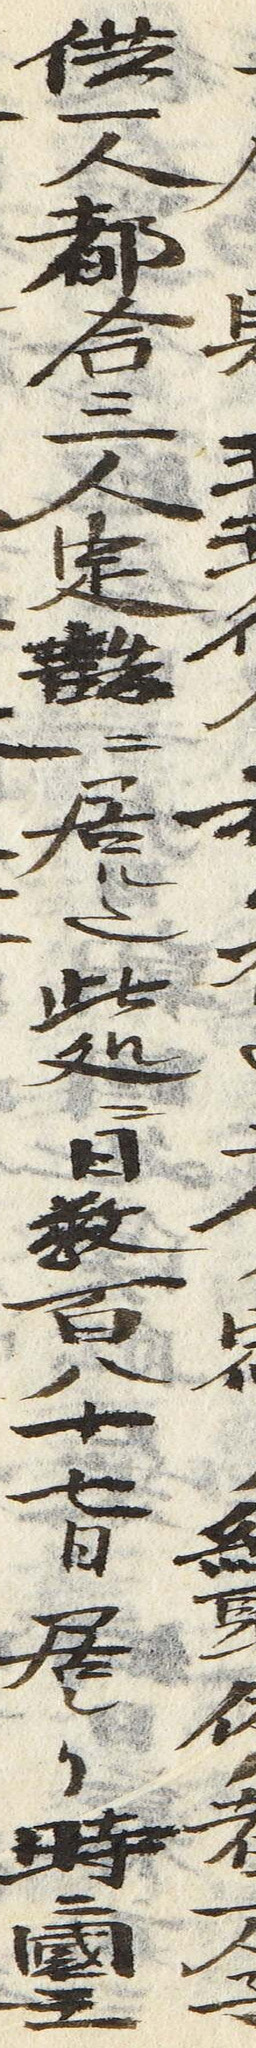共一人都合三人定ニ居ル也此処ニ日数百八十七日居リ時ニ国王
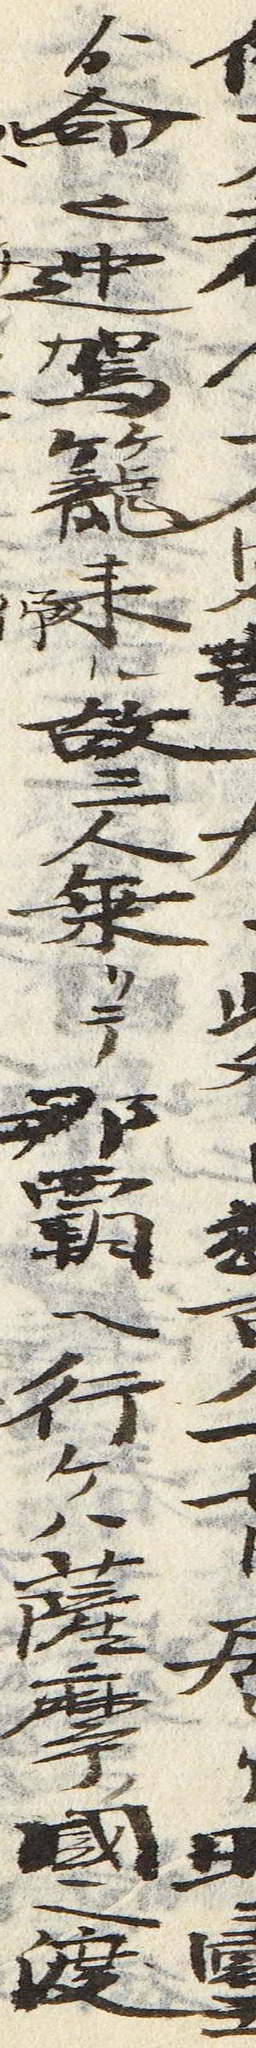ゟ命也迚駕籠来ル故三人乗リテ那覇へ行ケハ薩摩ノ国也渡
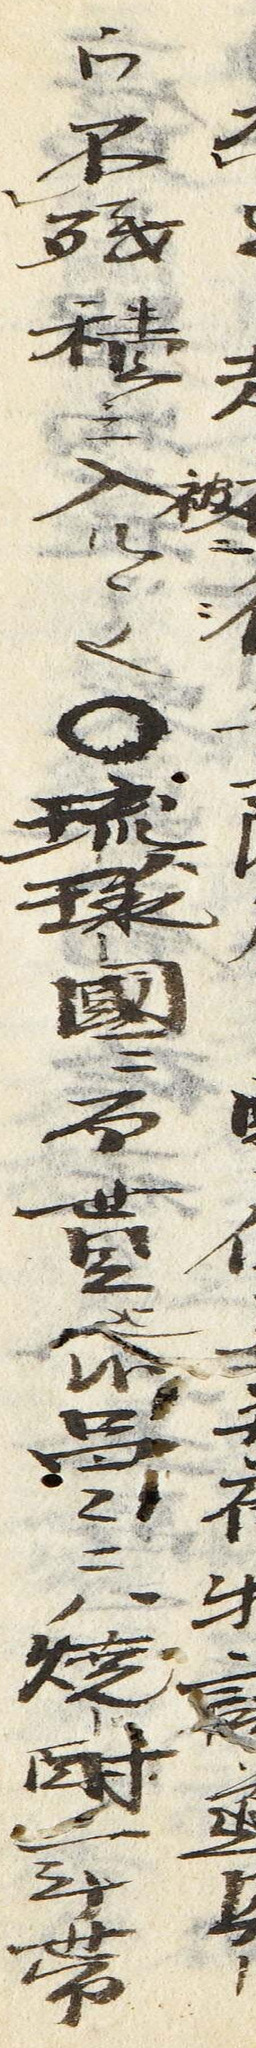ウ不残積ミ入ルヽ也〇琉球国ニ而貰候品々ニハ焼酎一斗帯

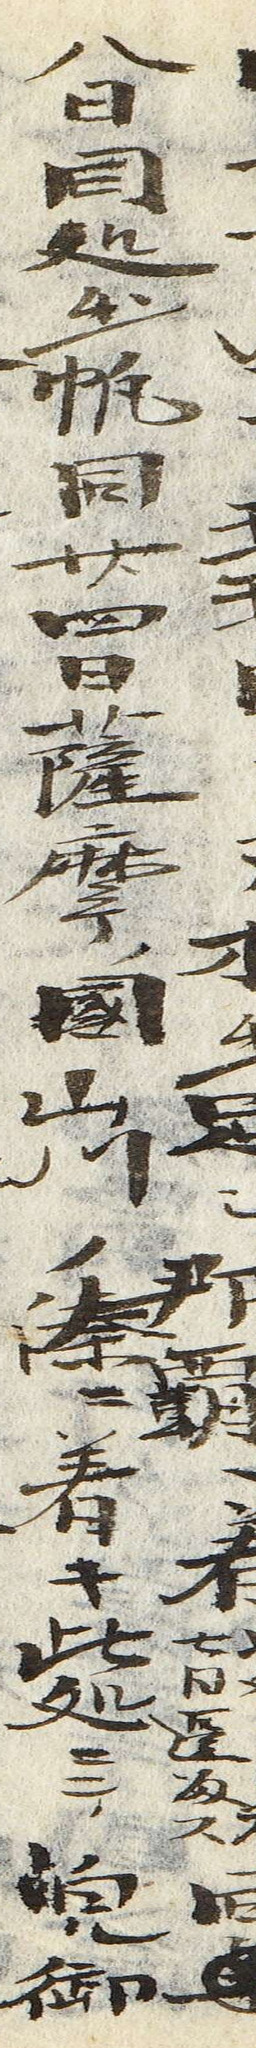八日同処出帆同廿四日薩摩ノ国山川ノ湊ニ着キ此処ニテ泊ル御
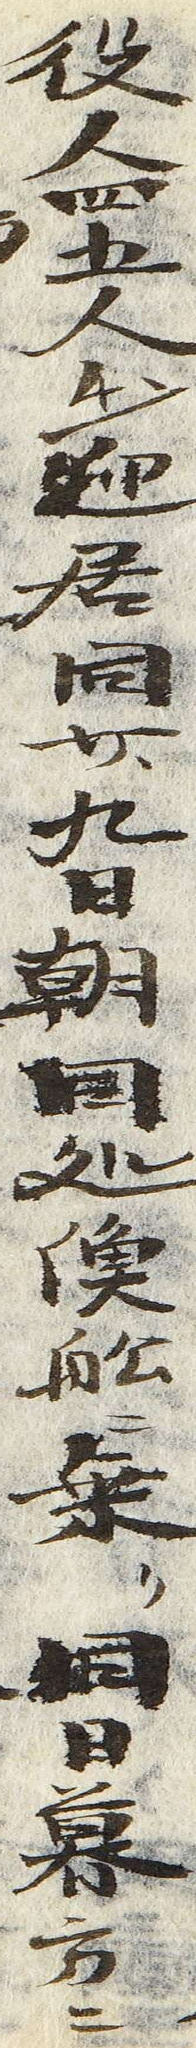役人四五人出迎居同廿九日朝同処漁船ニ乗リ同日暮方ニ
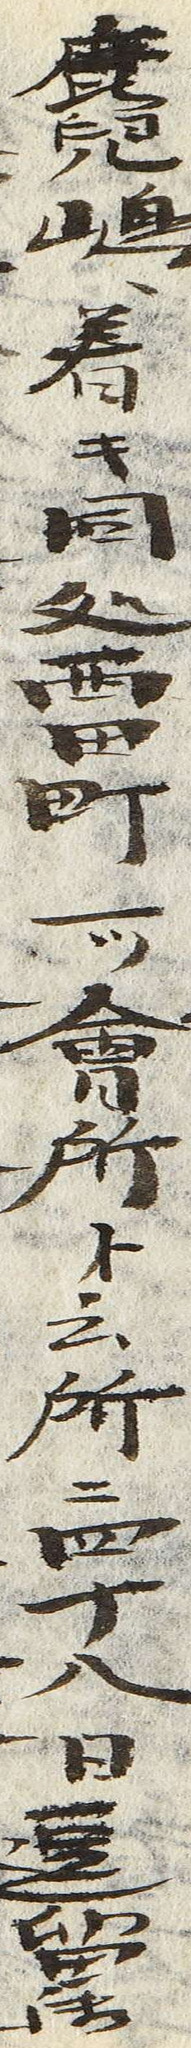鹿児島へ着キ同処西田町一ツ会所ト云所ニ四十八日逗留御
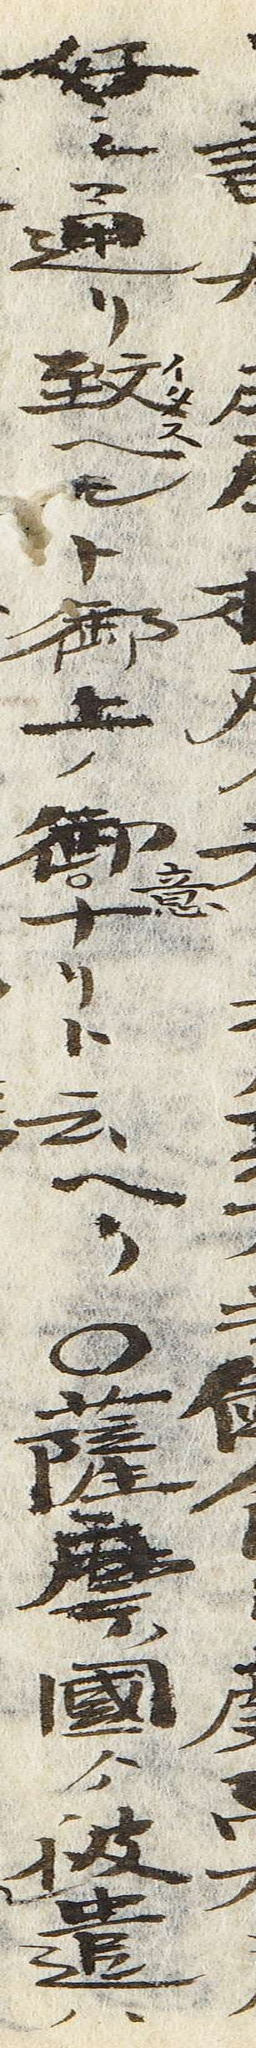好ミ通リ致ヘシト御上ノ御意ナリト云ヘリ〇薩摩ノ国ゟ被遣ハ
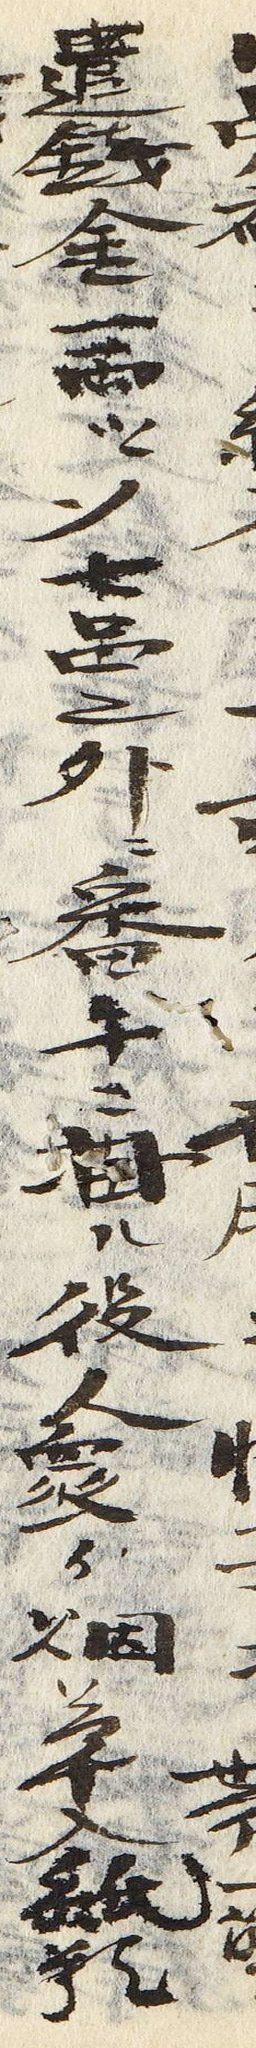遣銭金一両ツヽ〆七品也外ニ番ニ掛ル役人衆ゟ煙草入紙類
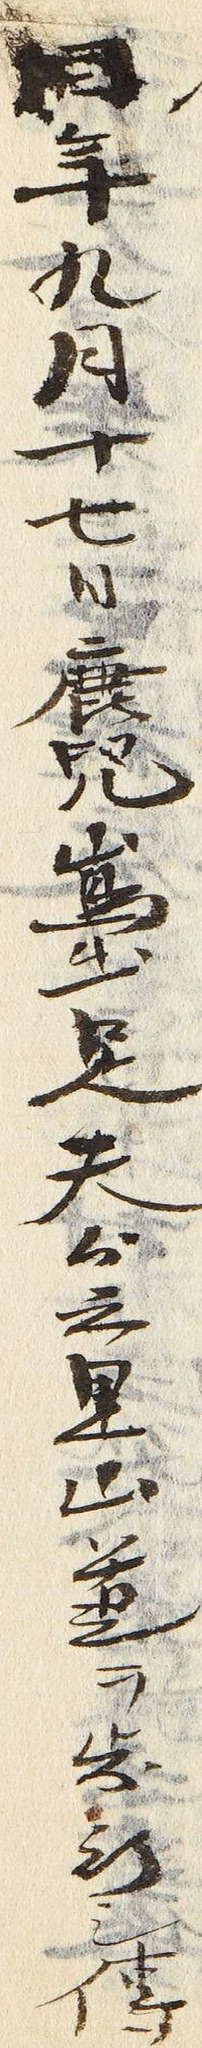同年九月十七日鹿児島出足夫ゟ之里山道ヲ歩行シ転
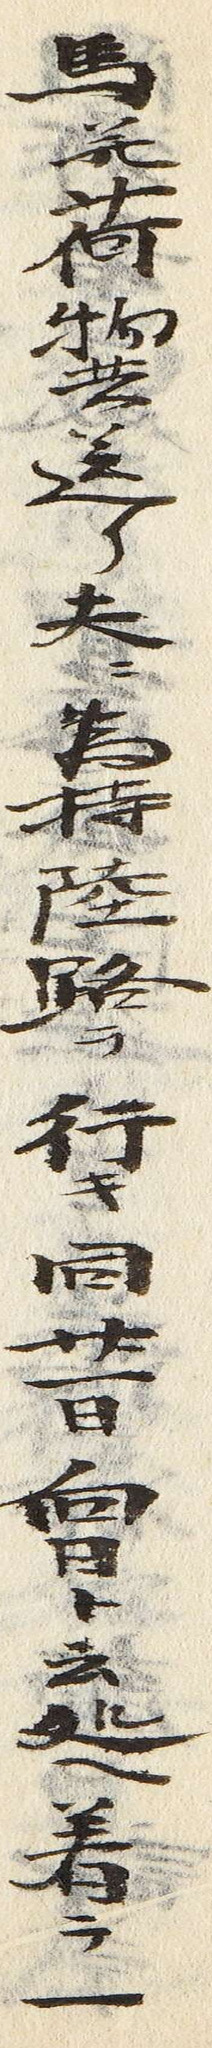馬并荷物共送リ夫ニ為持陸路ヲ行キ同廿一日向日ト云処へ着テ一
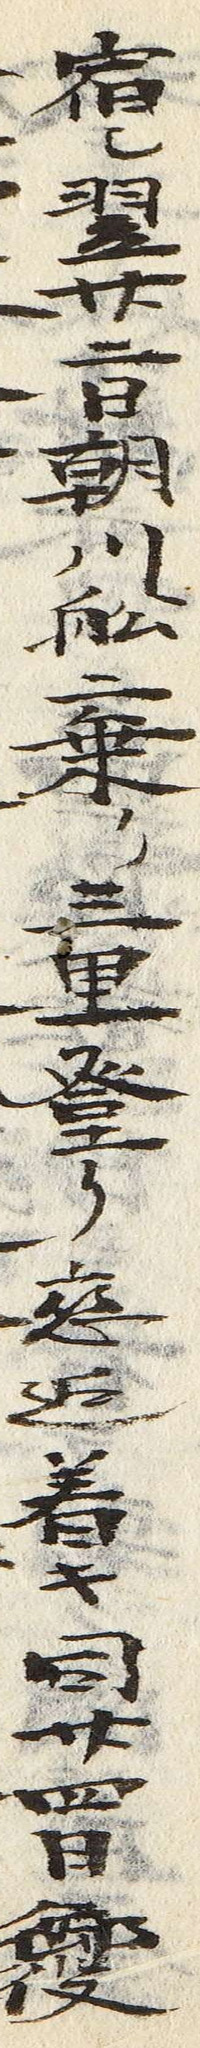宿シ翌廿二日朝川船ニ乗リ三里登リ恋浜着キ同廿四日御役
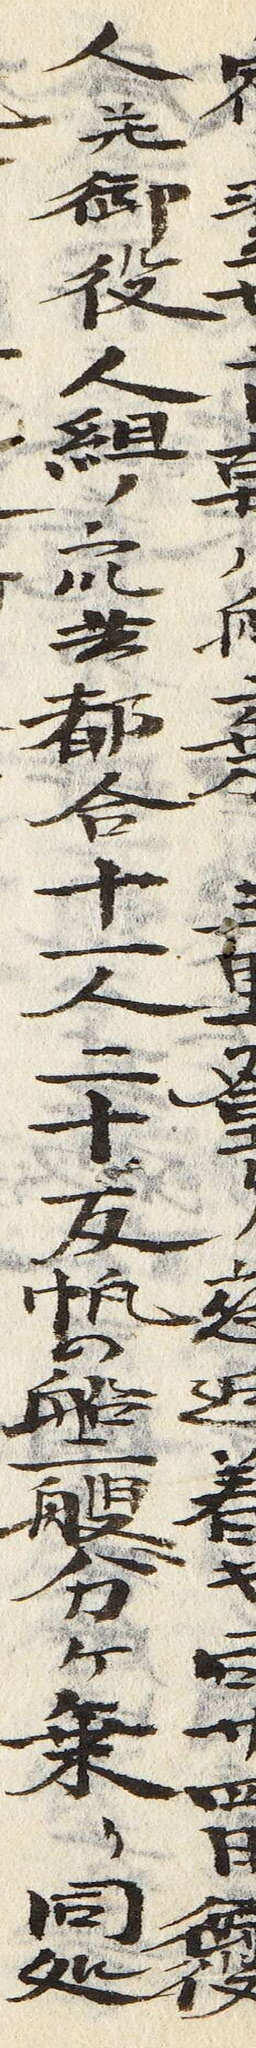人并御役人組ノ衆共都合十一人二十反帆の船二艘へ分ケ乗リ同処
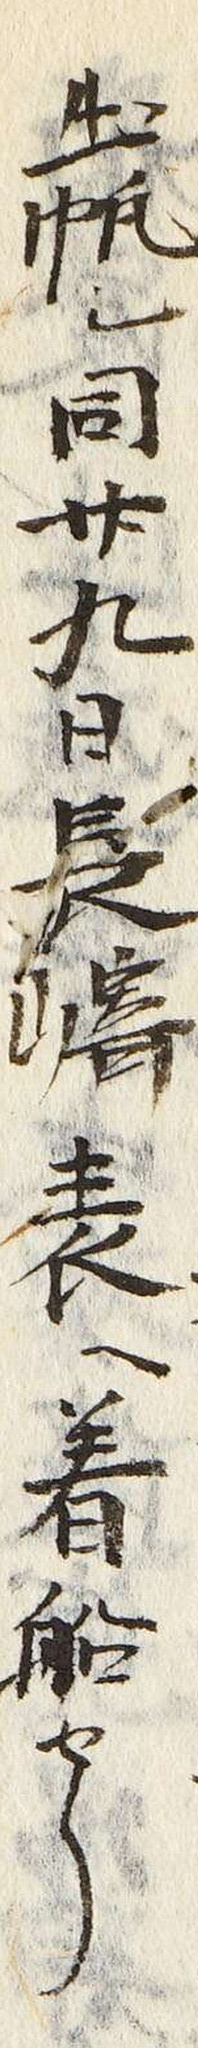出帆シ同廿九日長崎表ヘ着船セリ
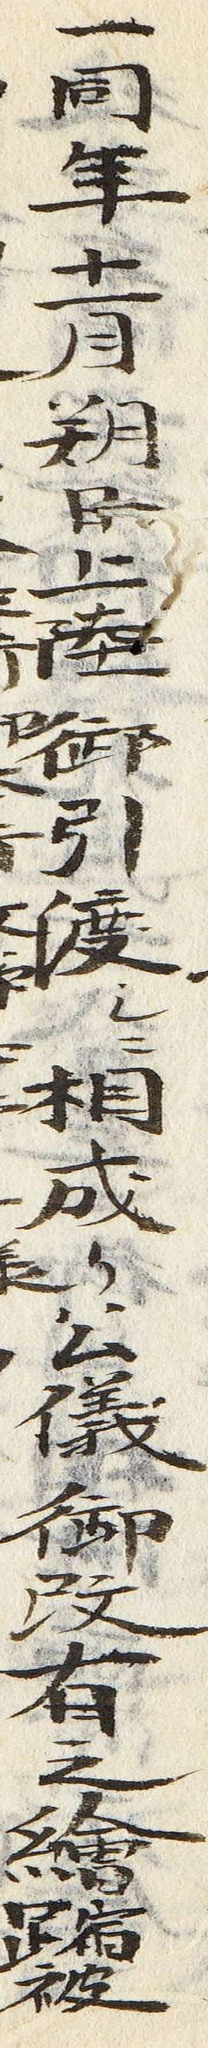一同年十一月朔日上陸御引渡シニ相成リ公儀御改有之絵踏被
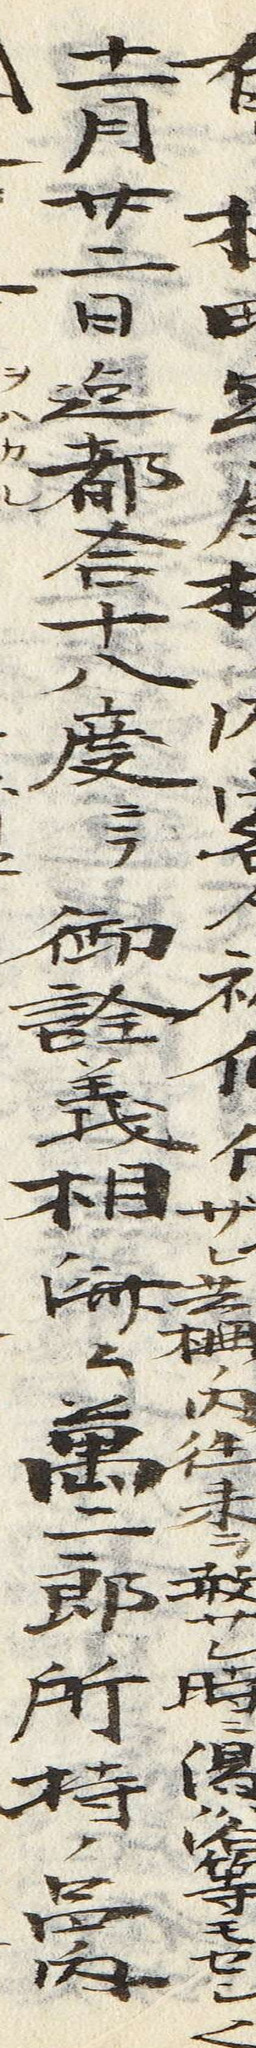十一月廿二日迄都合十八度ニテ御詮義相済ム萬二郎所持ノ品ノ内
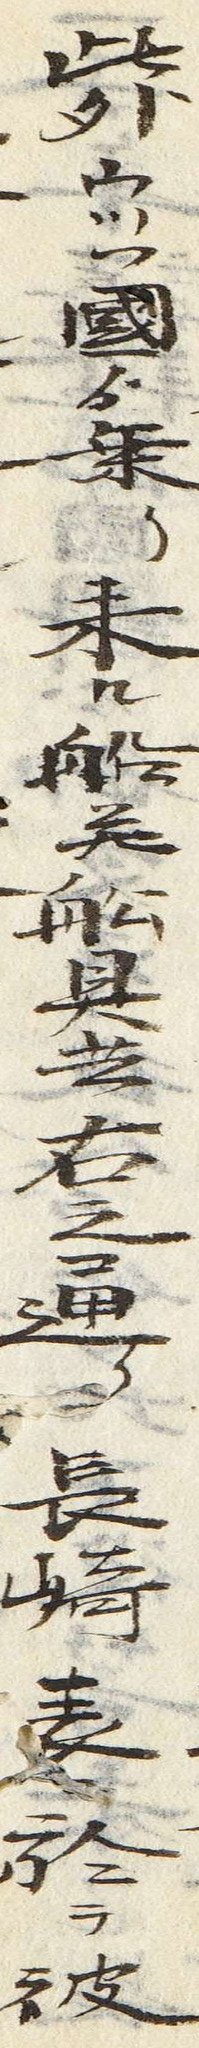此外ウツフ国ゟ乗リ来ル船并船具共右之通リ長崎表ニ於テ被
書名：漂流記聞
